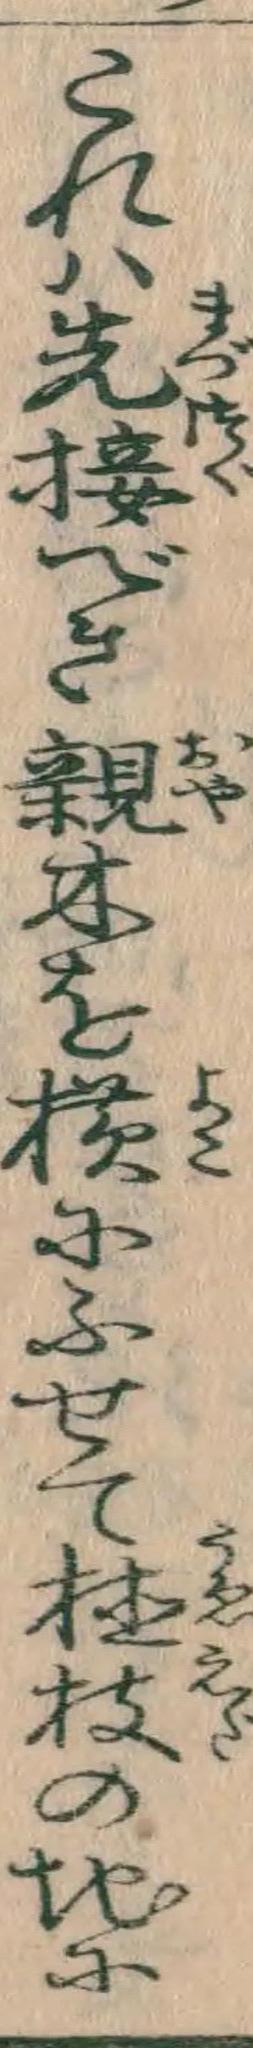これは先接べき親木を横にふせて植枝の地に
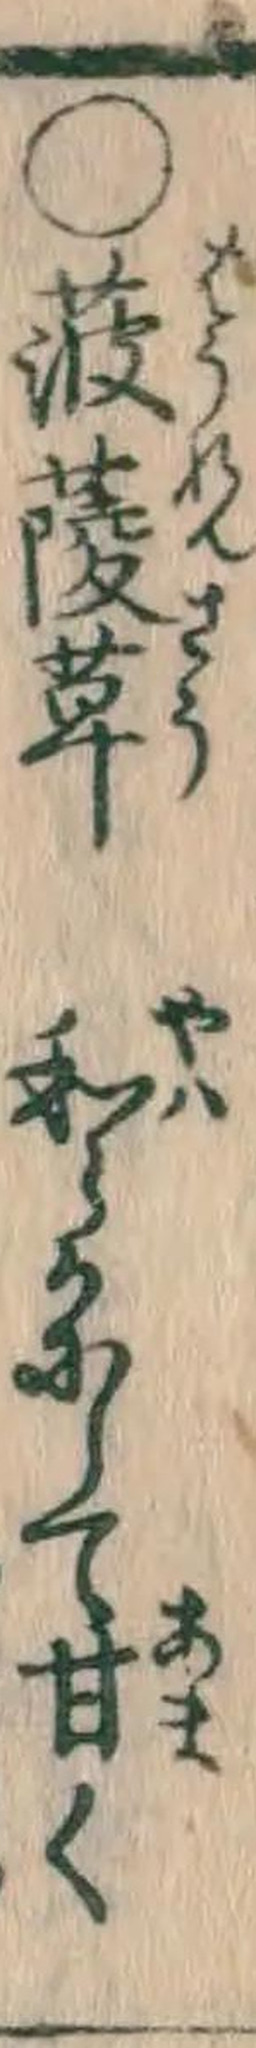○菠䔖草和らかにして甘く
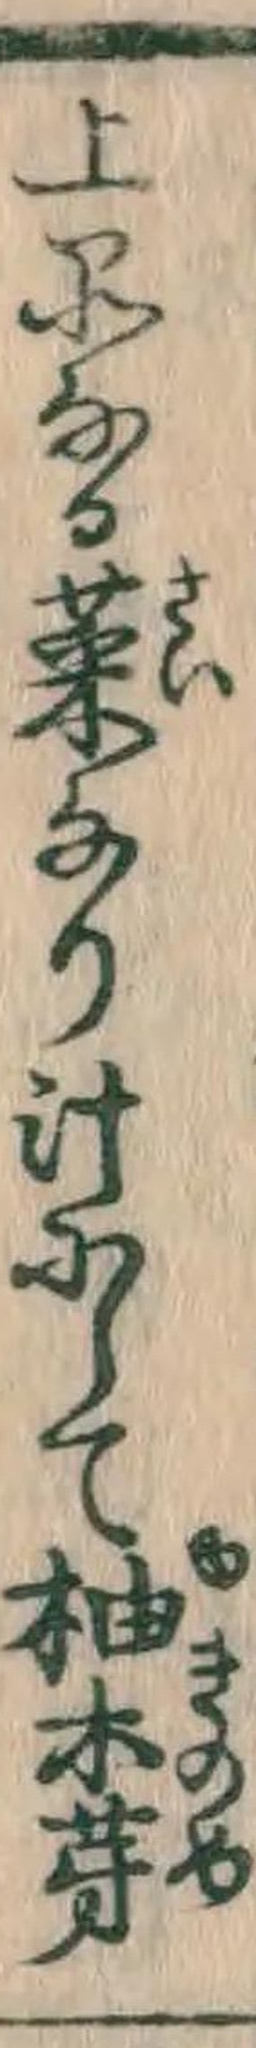上品なる菜なり汁にして柚木芽
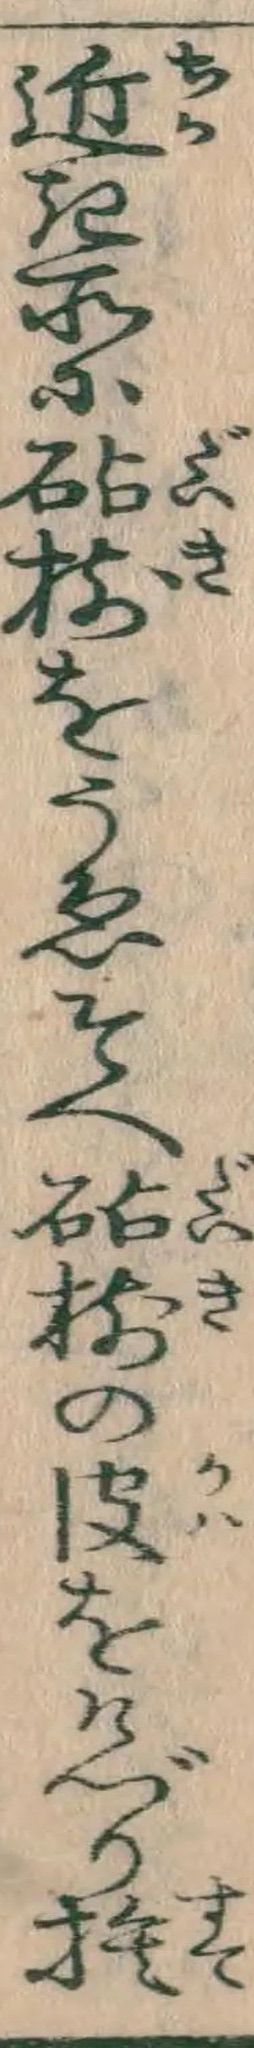近き所に砧樹をうゑそへ砧樹の皮をけづり捨
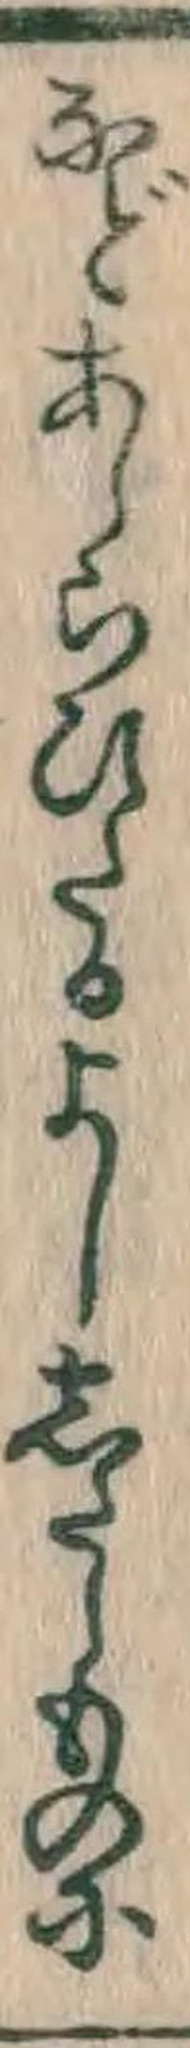などあしらひたるよししたしものに
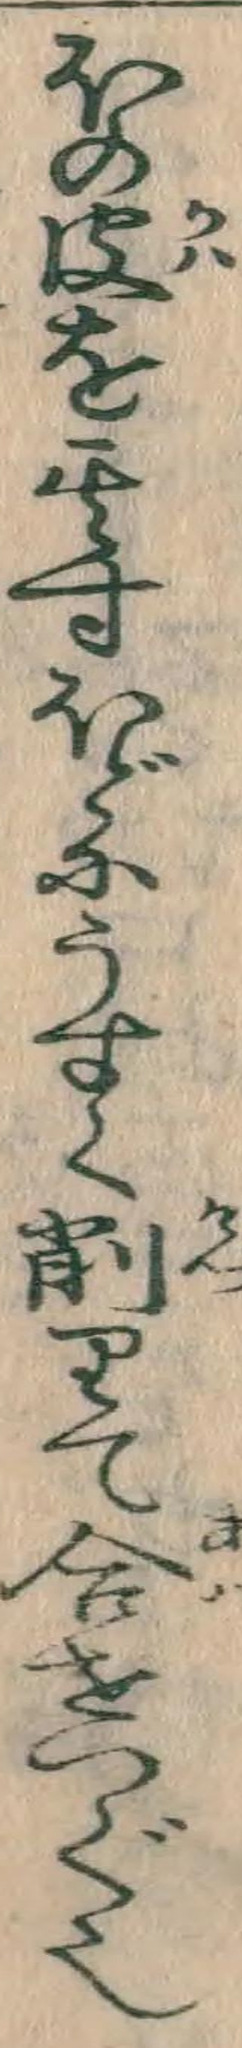ほの皮を其寸ほどにうすく削りて合せつぐ也
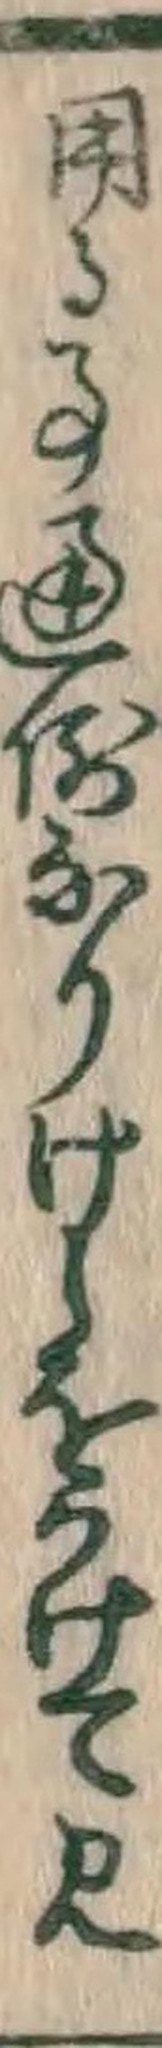用る事通例なりけしをかけて見
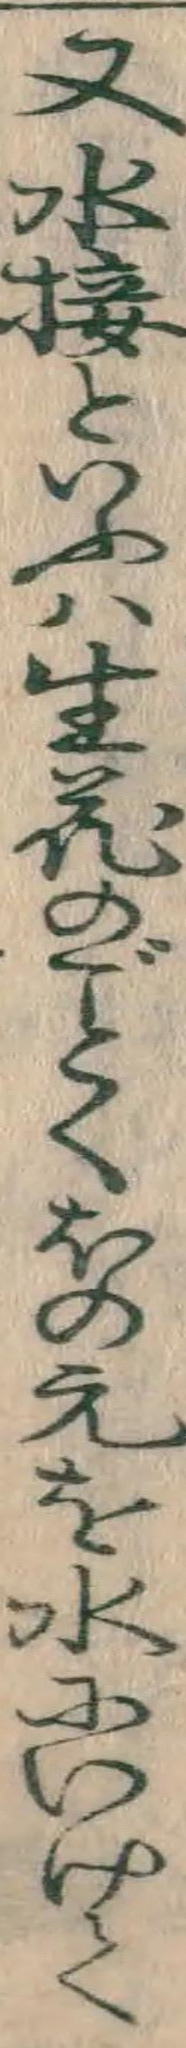又水接といふは生花のごとくほの元を水にいけて
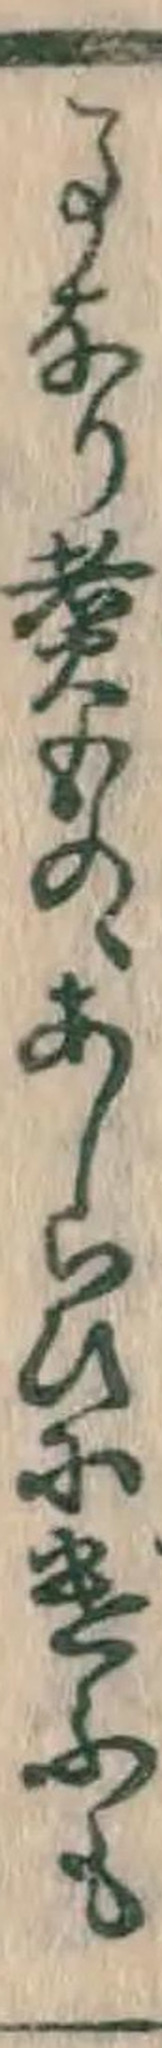るなり煮ものゝあしらひに遣ふも
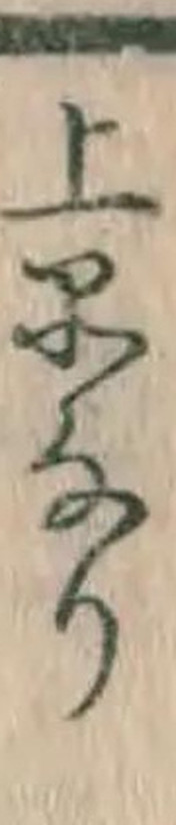上品なり
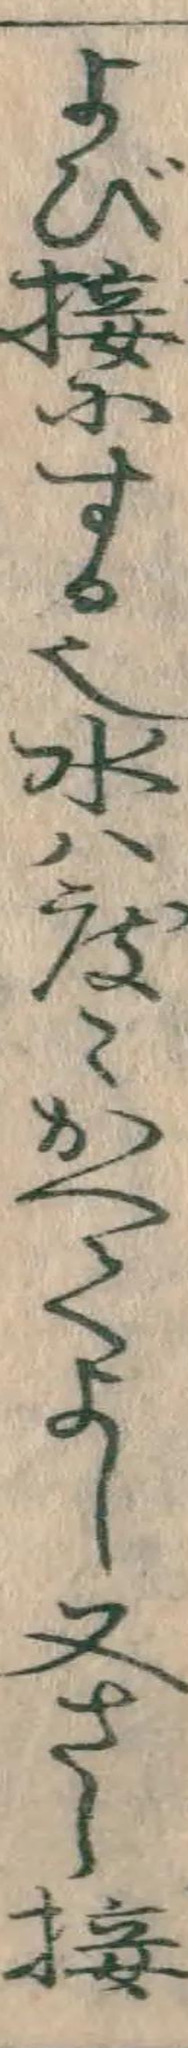よび接にする也水は度々かへてよし又さし接
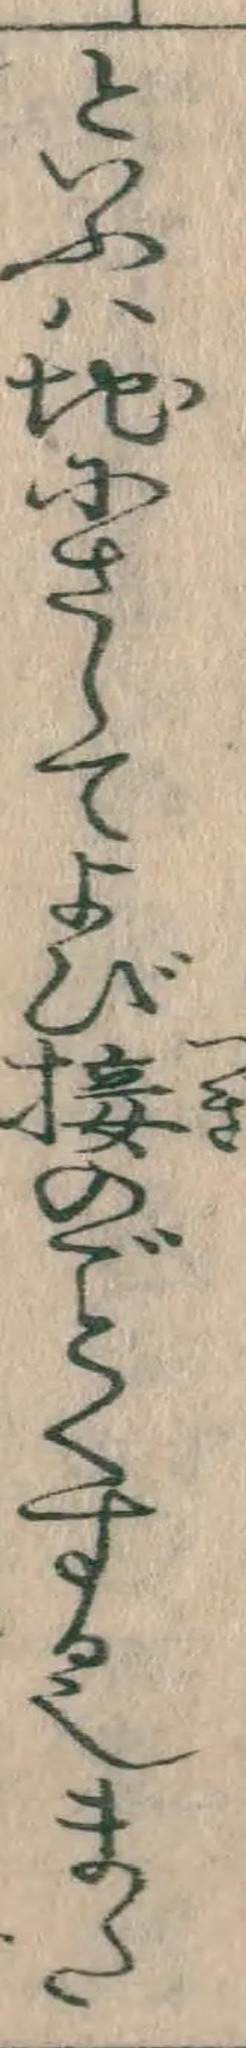といふは地にさしてよび接のごとくする也また
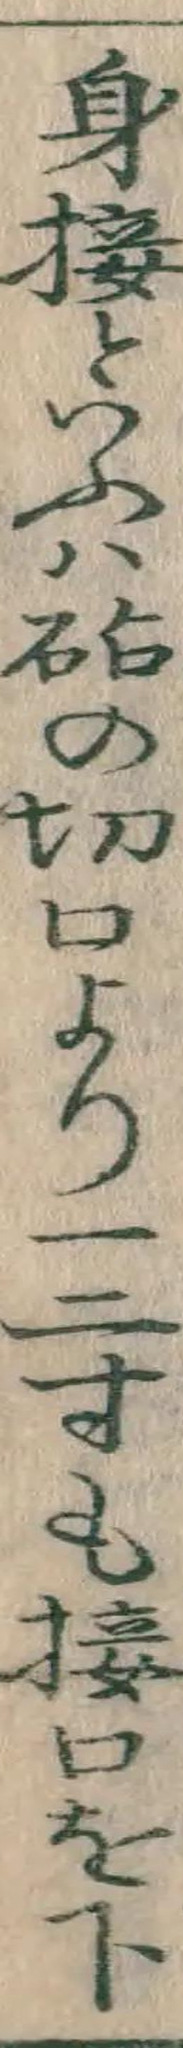身接といふは砧の切口より一二寸も接口を下
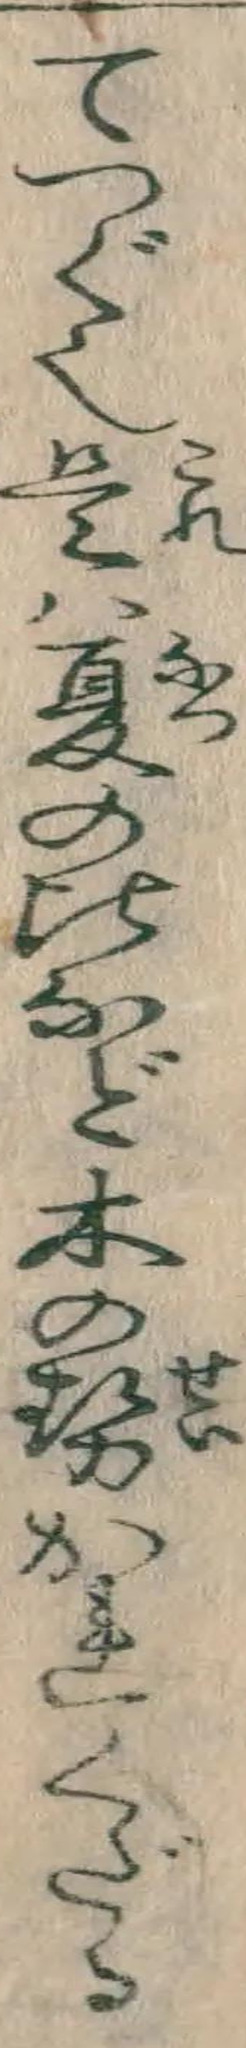てつぐ也是は夏の比など木の勢かれくだる
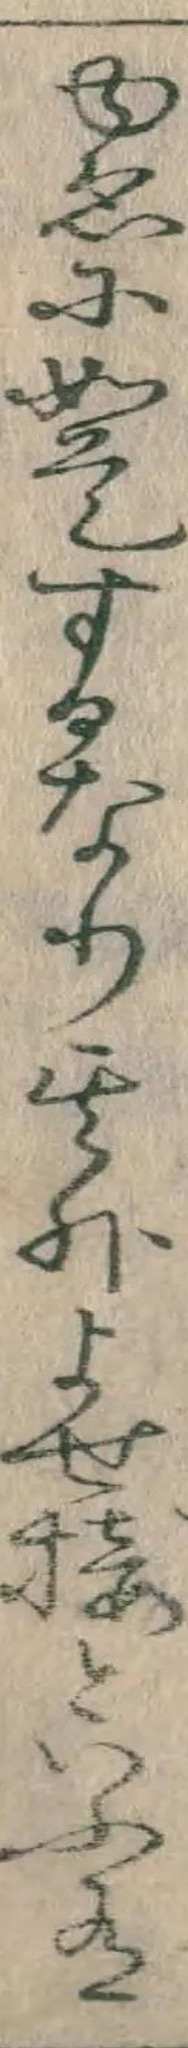ゆゑに如是するなり其外よせ接といふ有
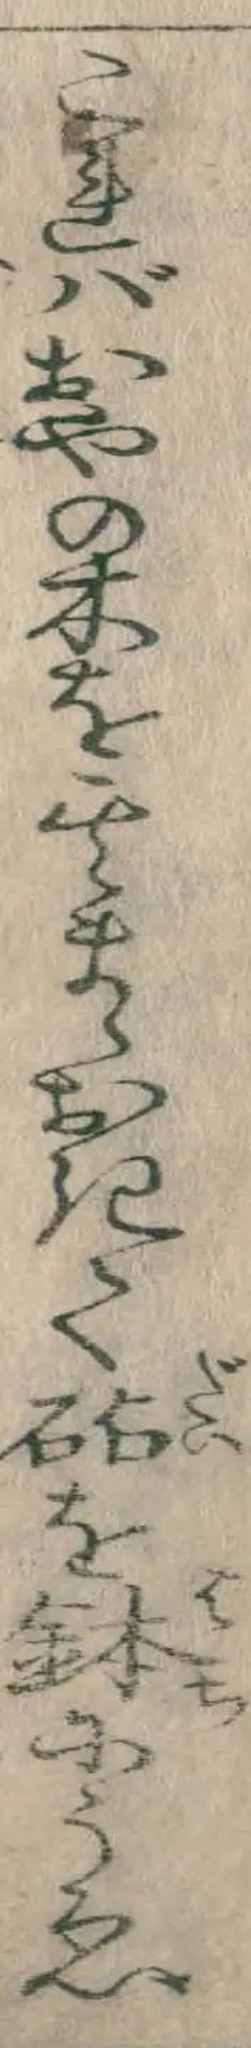こればおやの木を其まゝおきて砧を鉢にうゑ
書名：広益秘事大全 3巻. [5]
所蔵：国立国会図書館 National Diet Library, JAPAN
